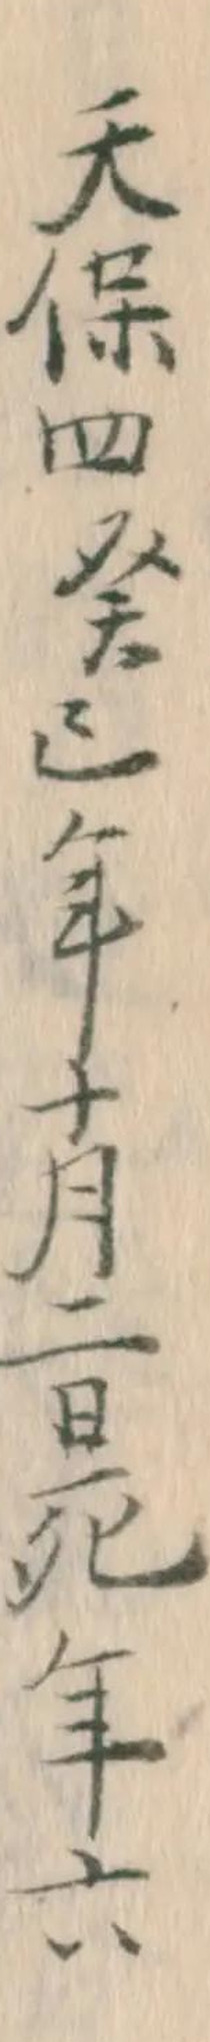天保四癸巳年十月二日死年六
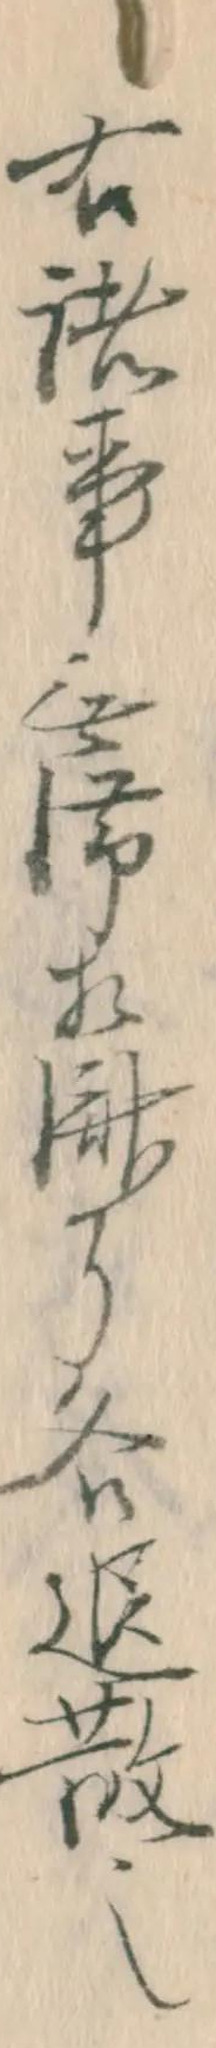右諸事無滞相済了各退散也
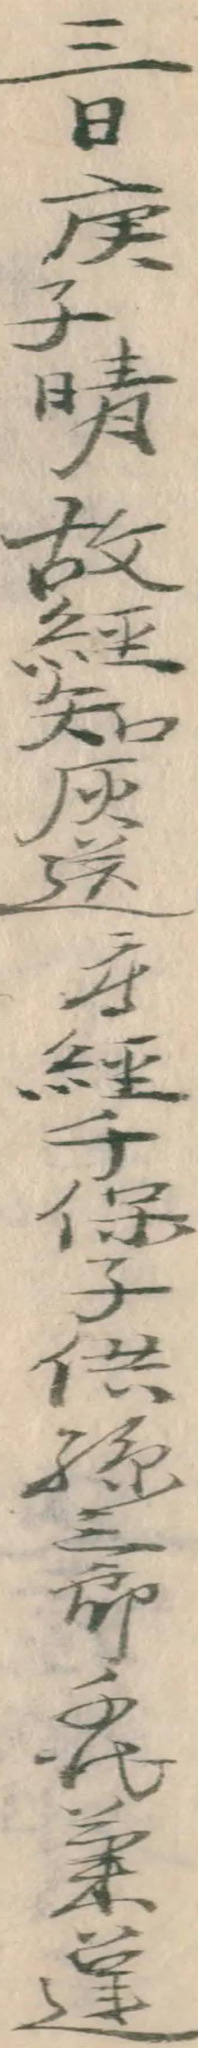三日庚子晴故経知灰送ニ付経千保子供孫三郎千代兼召運
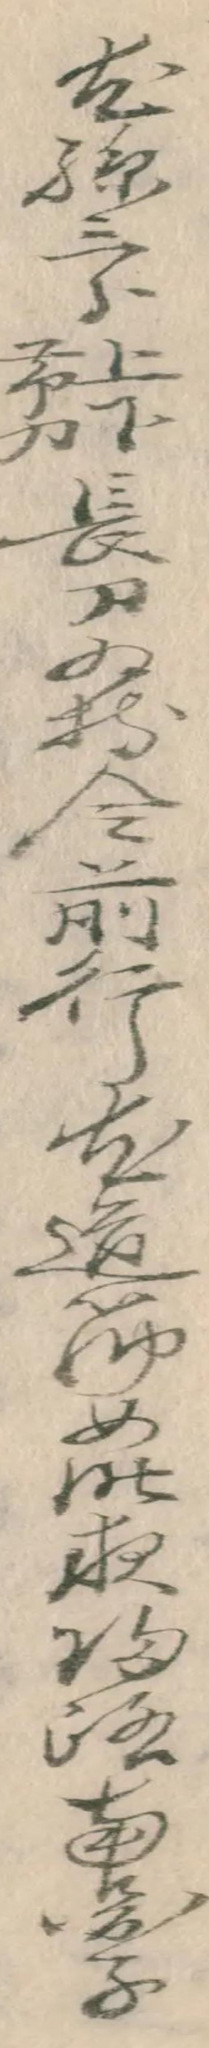尤孫三郎上下帯刀長刀為持令前行尤道筋如昨夜帰路南図子
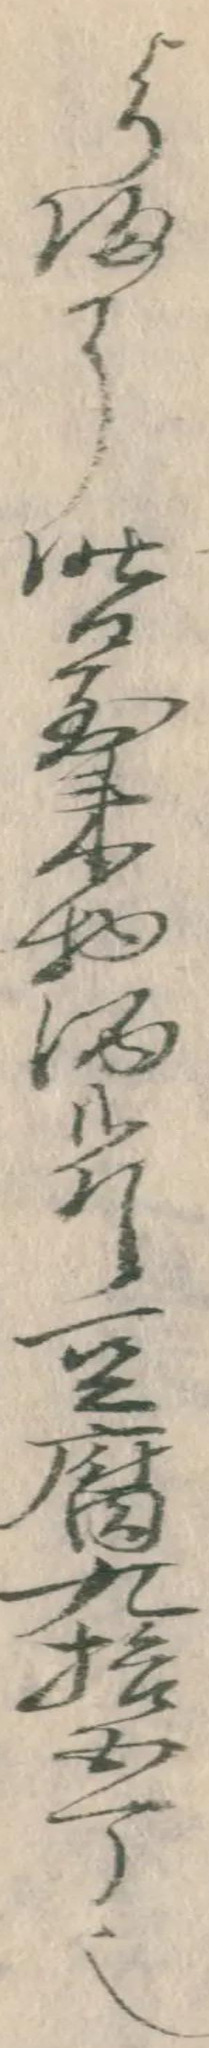より帰了昨日到来物酒弐升豆腐九拾五丁也
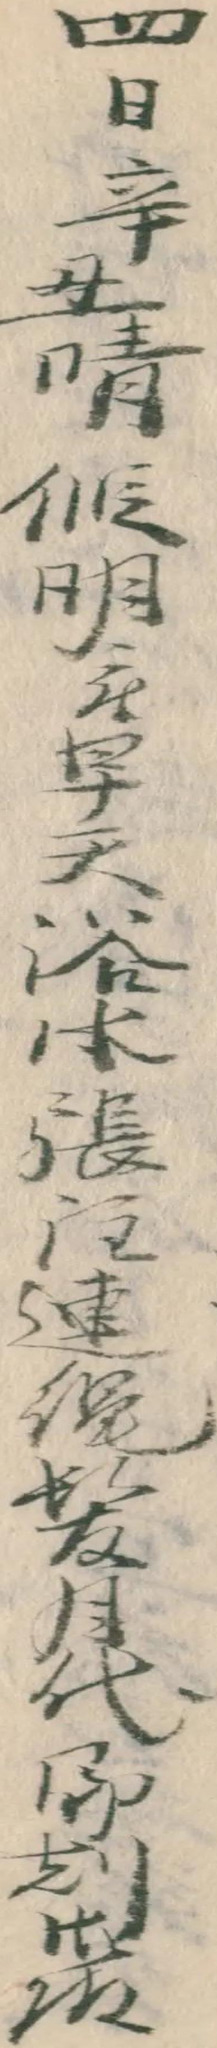四日辛丑晴假明ニ付早天浴水張注連縄髪月代即刻御殿
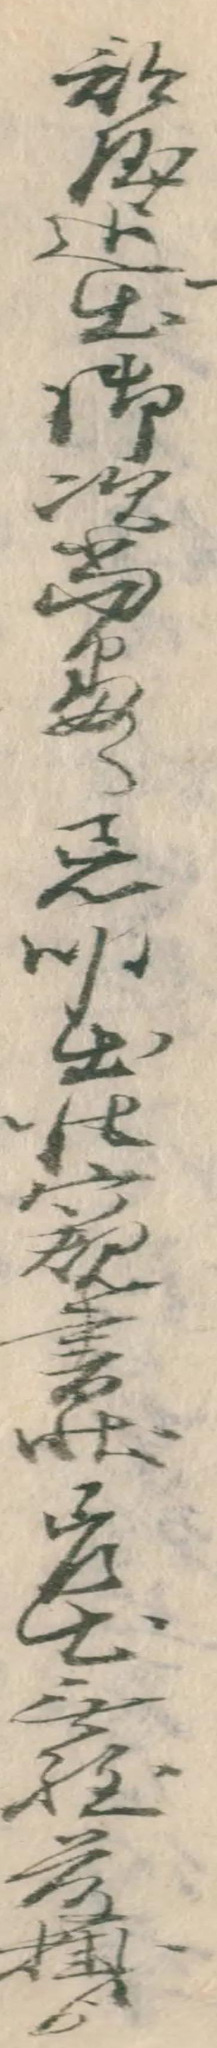部屋迄出御次當番へ忌明出仕窺書状差出無程藤掛ゟ
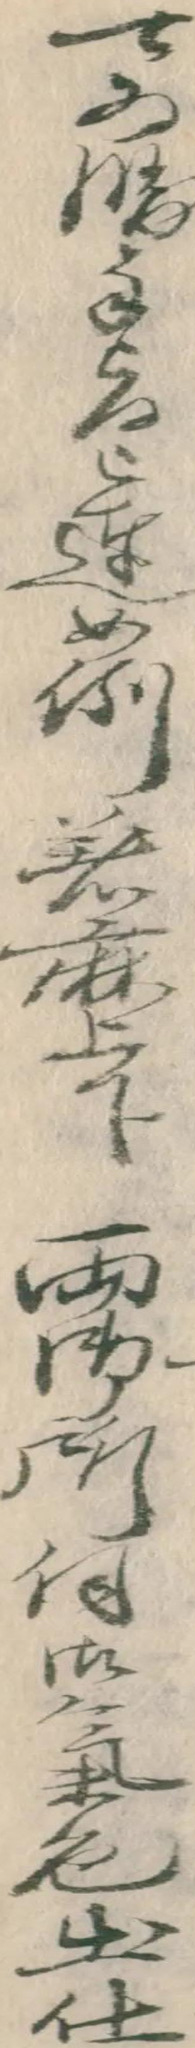可為勝手旨被達如例若麻上下両御祈伺御氣色出仕
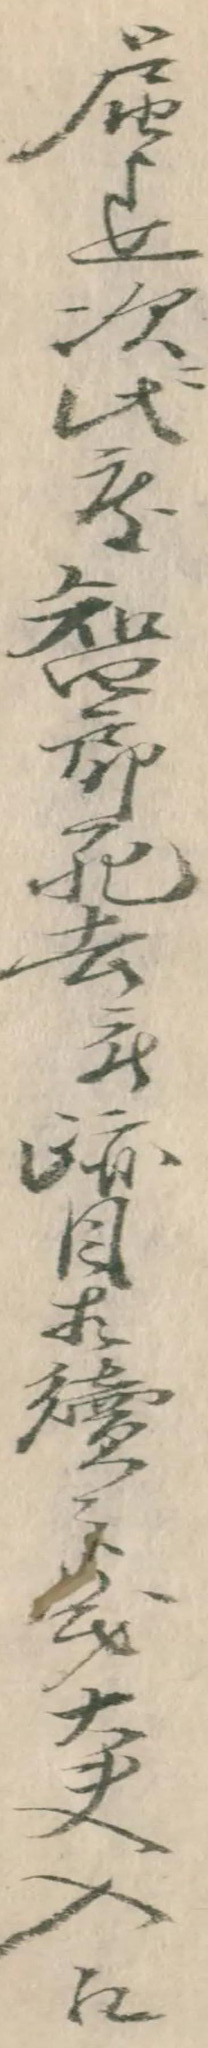御届申上次此度知四郎死去ニ付跡目相續之義大夫入江
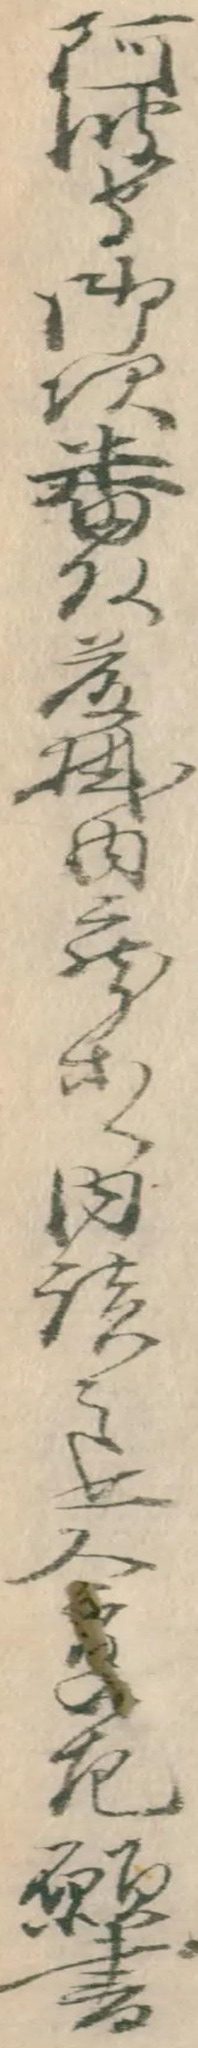阿波守御次番頭藤掛内蔵等へ内談之上合為左願書

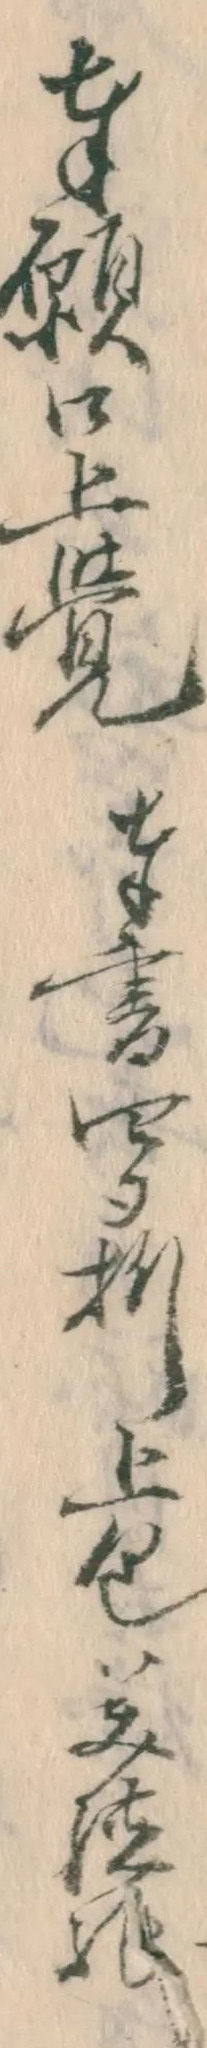奉願口上覚奉書四ツ折上包美濃紙
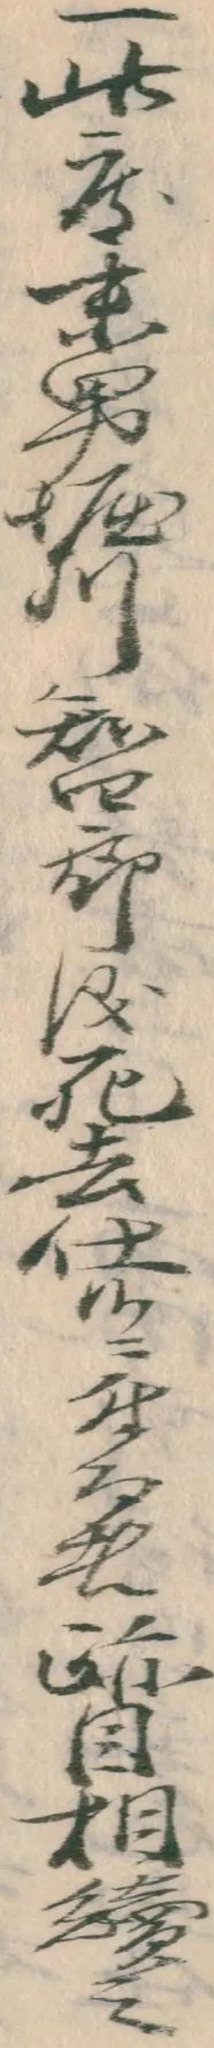一此度末男堀川知四郎儀死去仕候ニ付而は跡目相續之
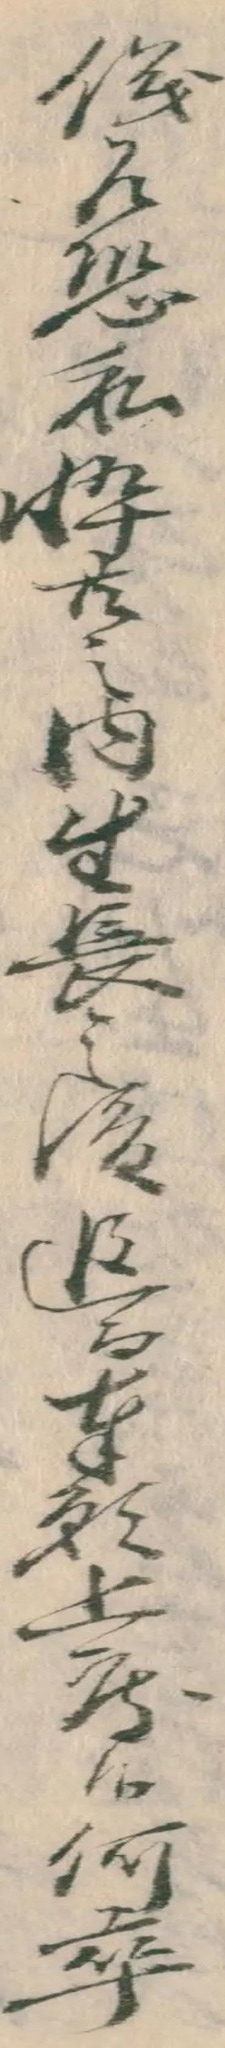儀乍恐私忰共之内生長之後追而奉願上度候何卒
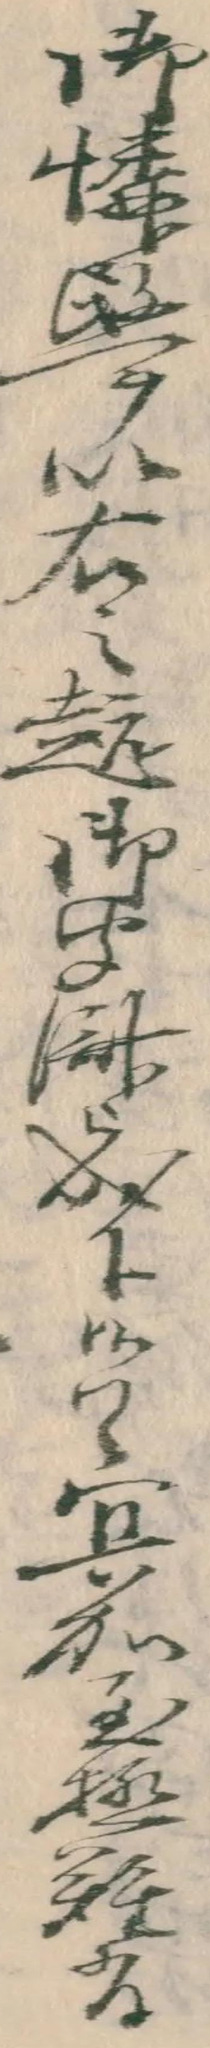御憐愍ヲ以右之趣御聞済被成下候ハヽ冥加至極難有
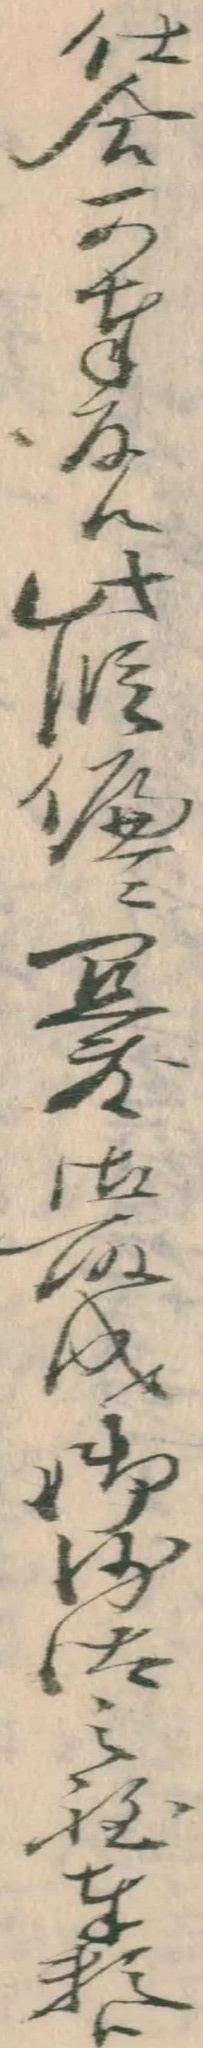仕合可奉存候此段偏にニ宜敷御取成御沙汰之程奉頼候以上
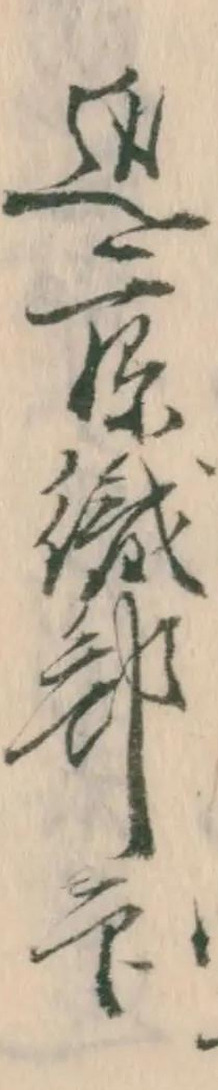近藤織部印
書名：賀茂社記録. 第66冊
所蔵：国立国会図書館 National Diet Library, JAPAN
